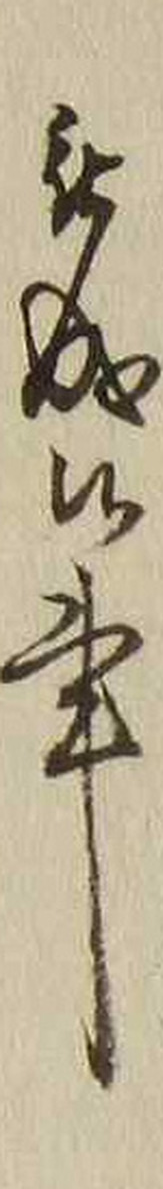被成候事
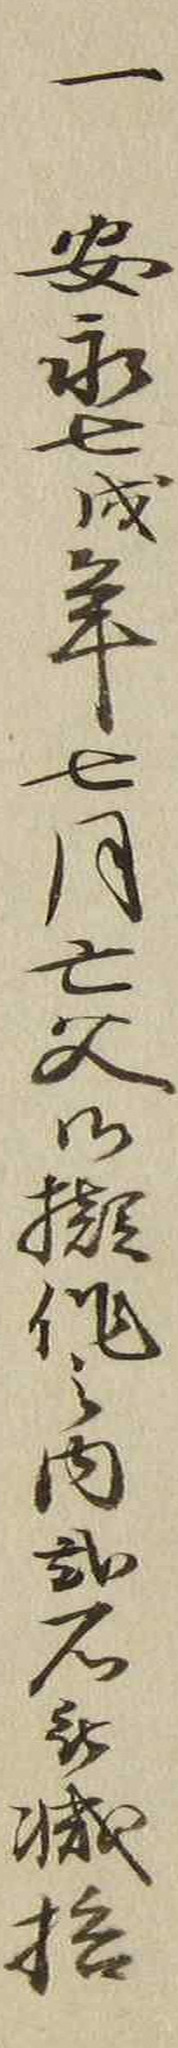一安永七戌年七月亡父御擬作之内弐石被減拾
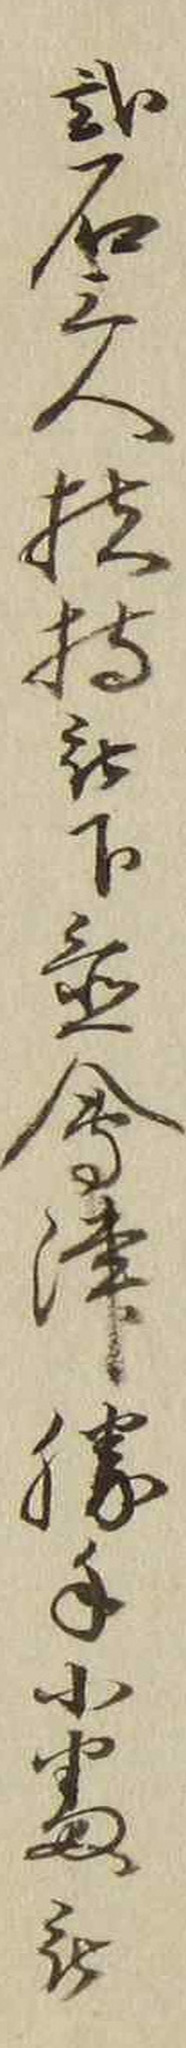弐石三人扶持被下置会津勝手小番被
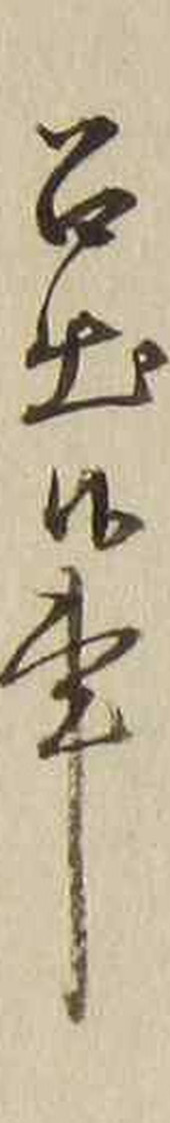召出候事

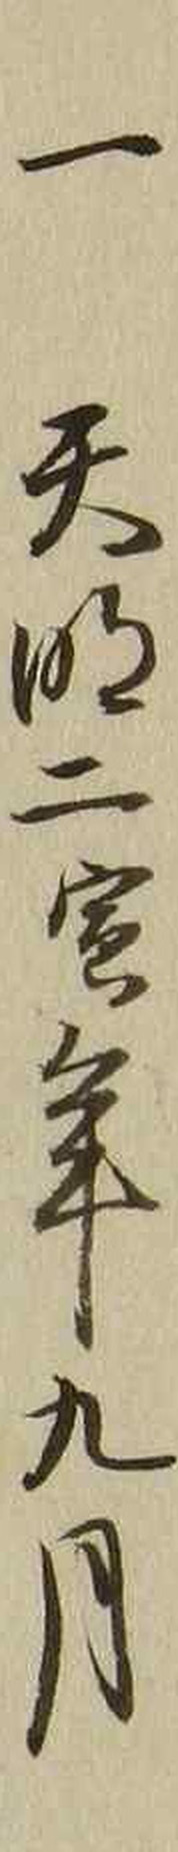一天明ニ寅年九月
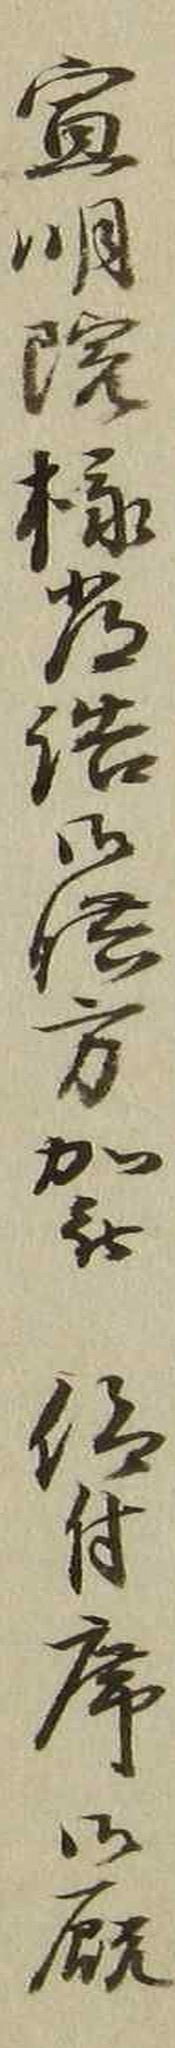宣明院様常詰御供方加被仰付席御厩
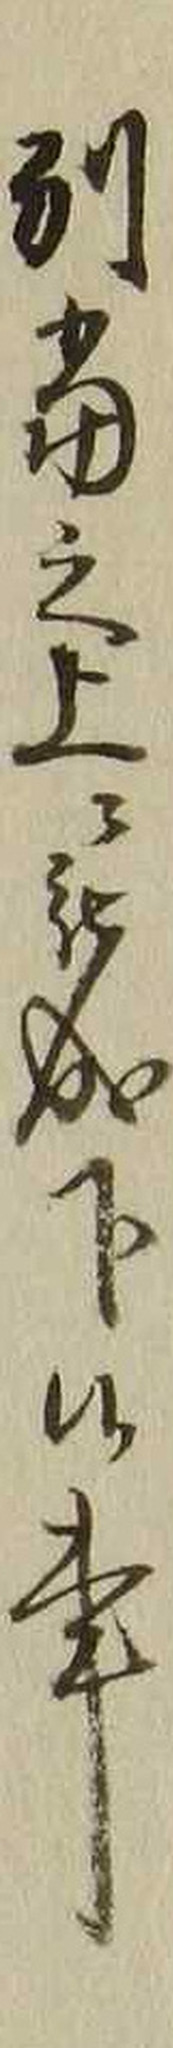列当之上ニ被成下候事
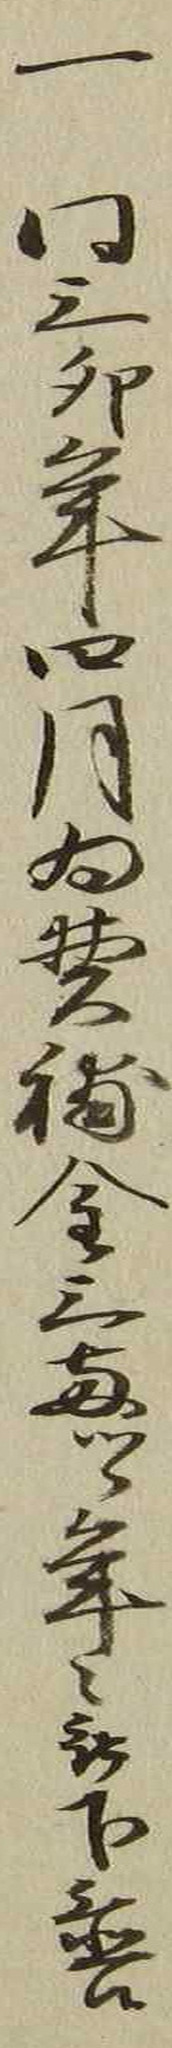一同三夘年四月ゐ貫補金三両ツヽ年々被下置候
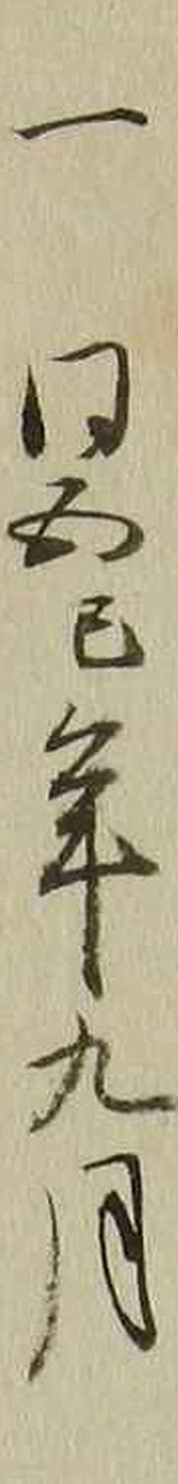一同五巳年九月
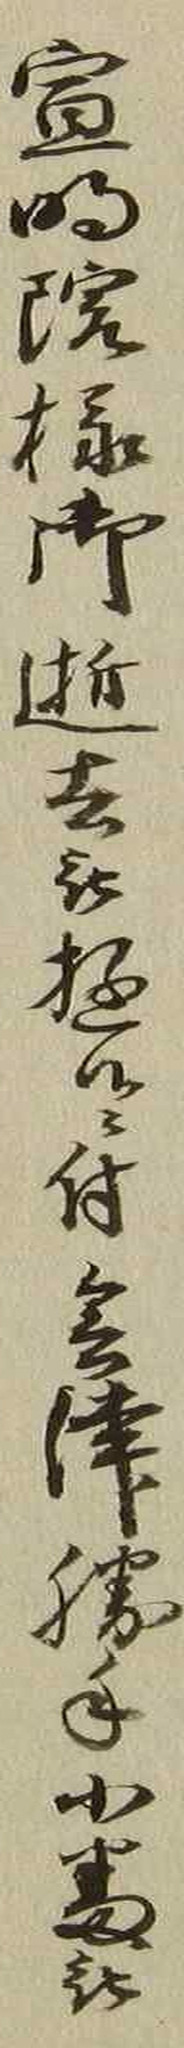宣明院様御逝去被遊候ニ付会津勝手小番被
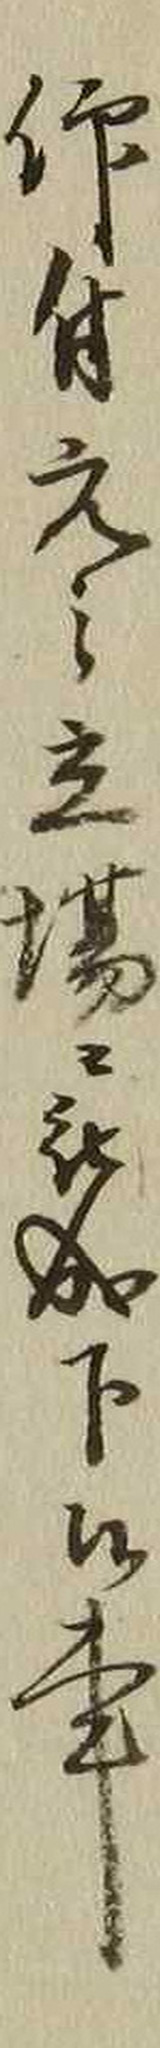仰付元之立場ニ被成下候事
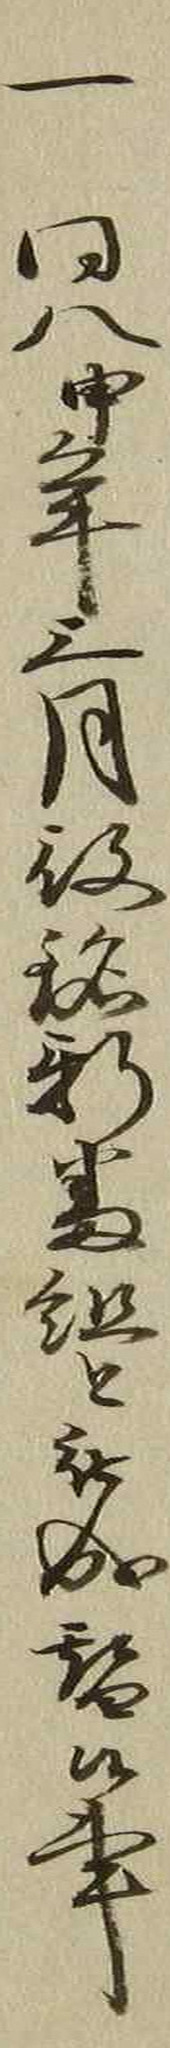一同八申年三月役銘新番組と被成替候事
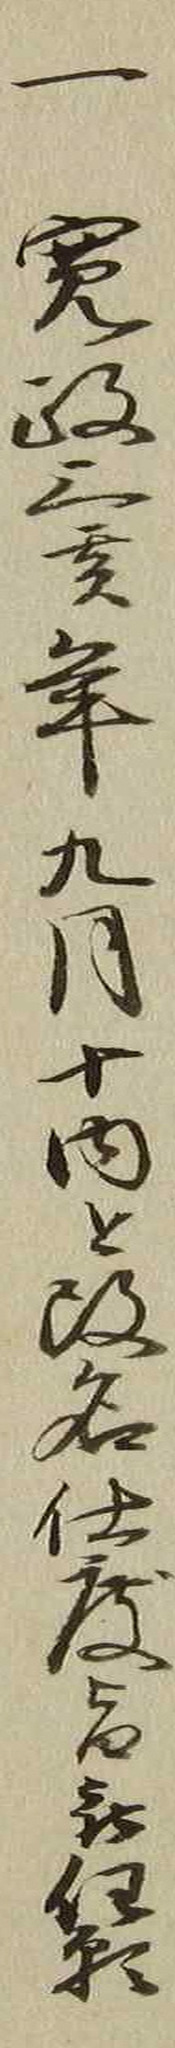一寛政三亥年九月十内と改名仕度旨被伺願
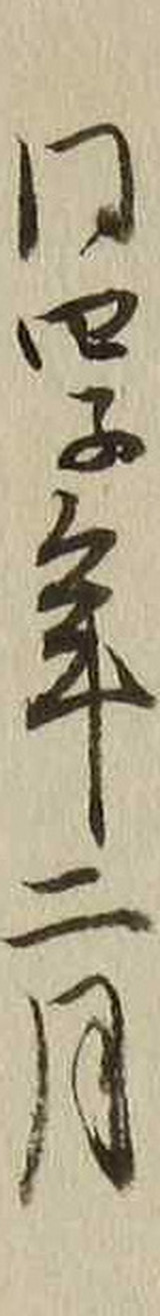一同四子年二月
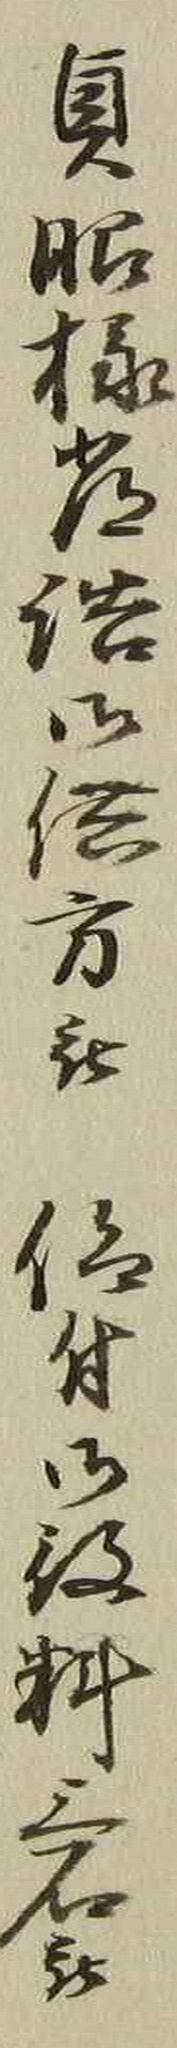貞昭様常詰御供方被仰付御役料三石被
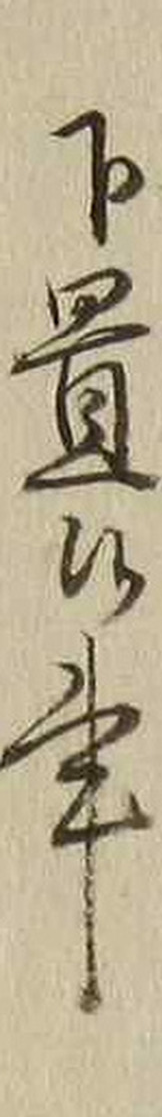下置候事
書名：諸士系譜　巻之114　か之部22
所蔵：会津若松市立会津図書館
